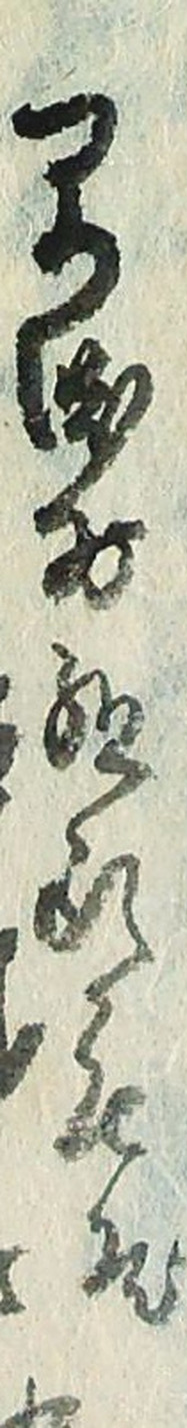早淵村組頭庄屋
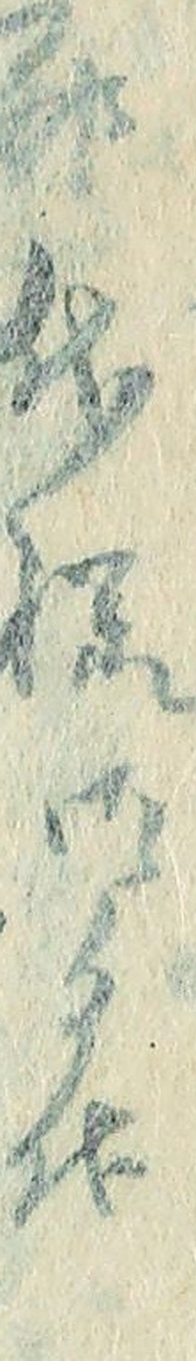御郡代様御手代
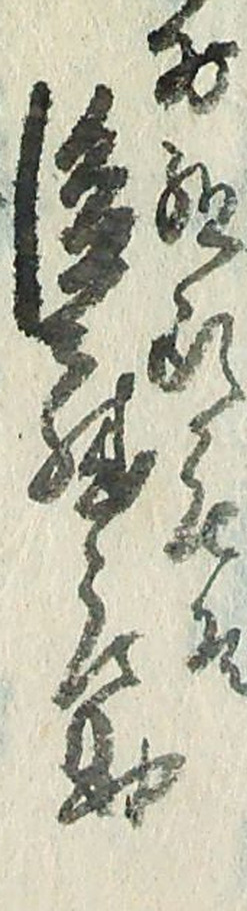後藤庄助
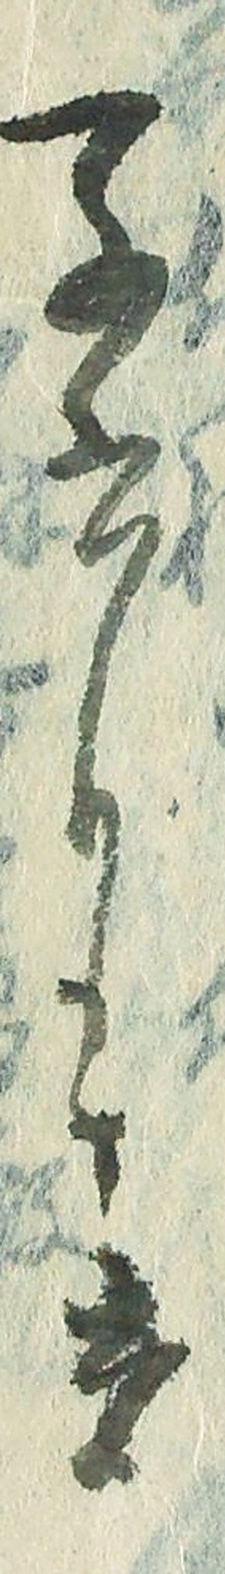子六月十六日
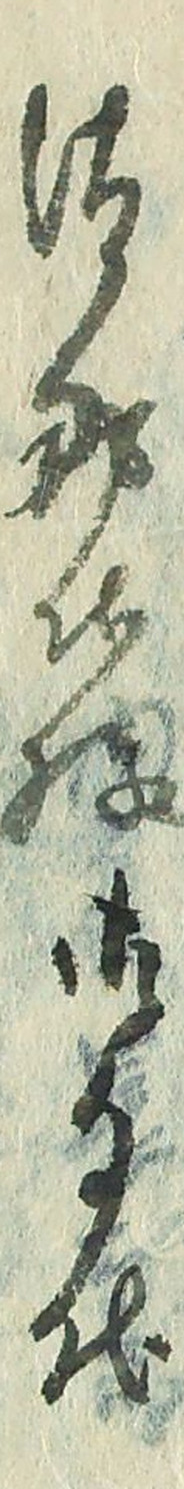御郡代様御手代
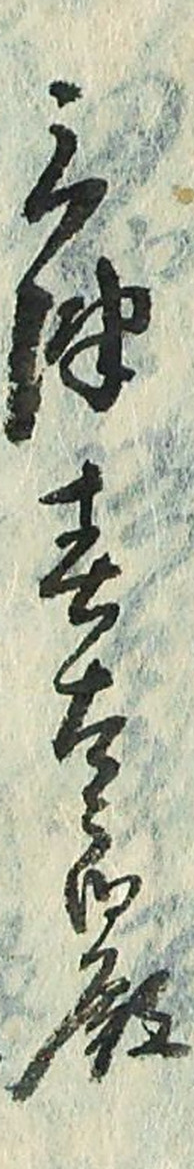三沢春太郎殿
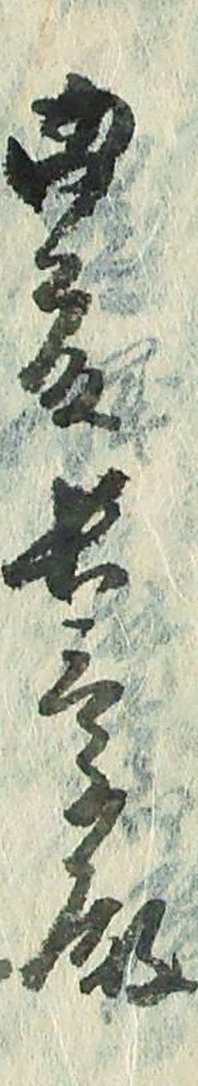内藤長三郎殿
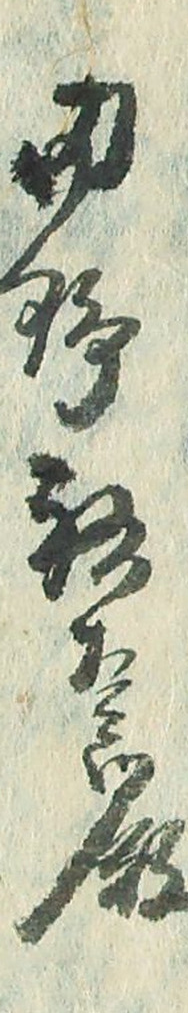田野祐太郎殿
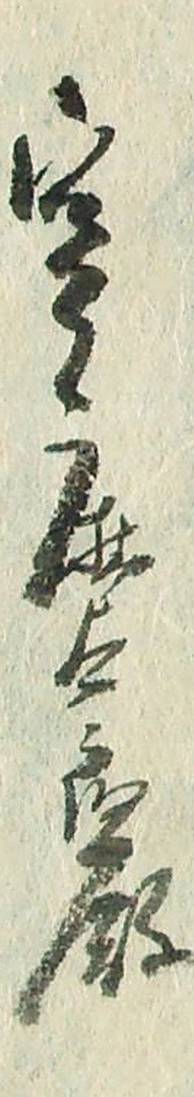宮麻太郎殿

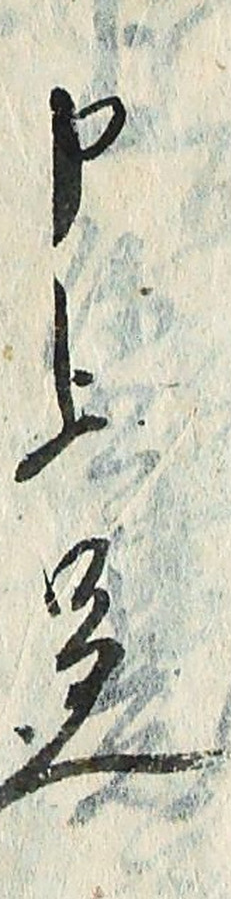申上覚
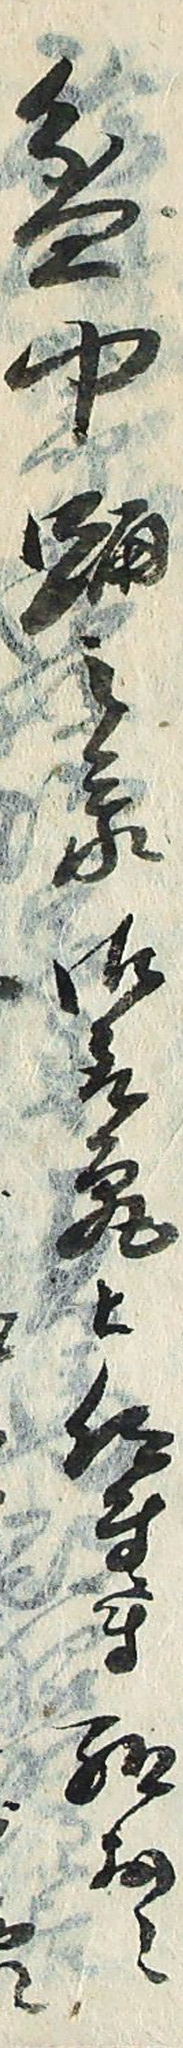盆中踊之義御取究被仰付候に付組村々
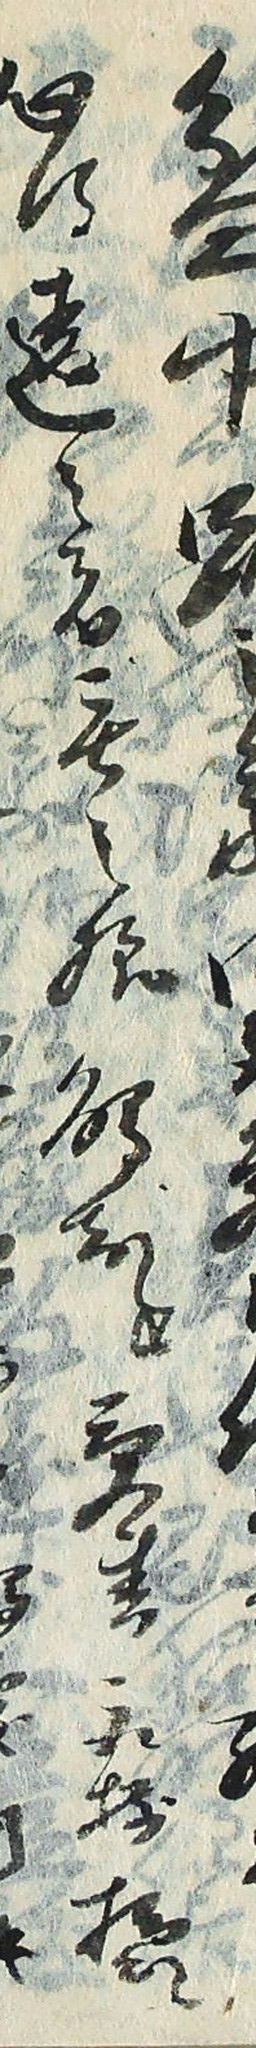心得違之者無之様触知せ受書取揃指出候
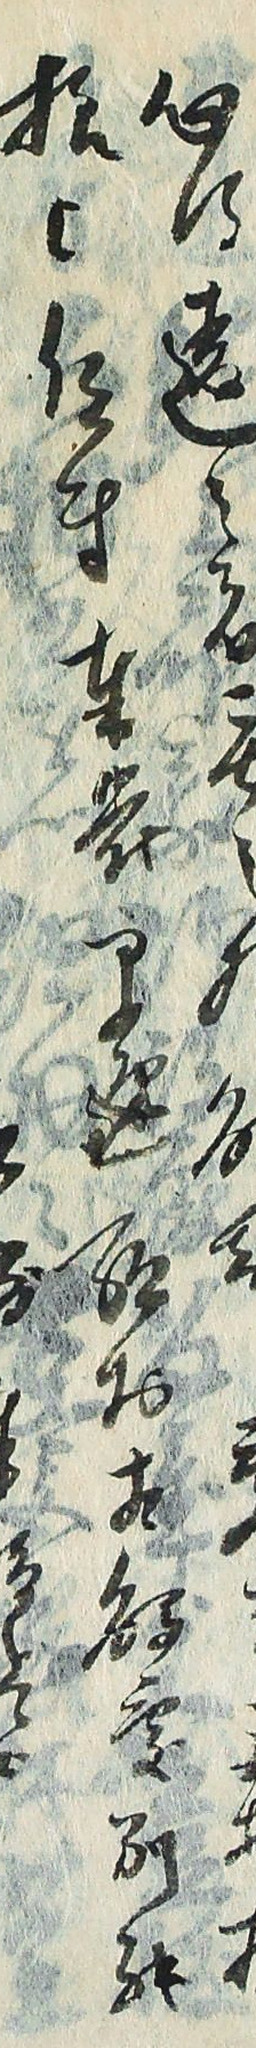様被仰付奉畏早速組村相触候所別紙
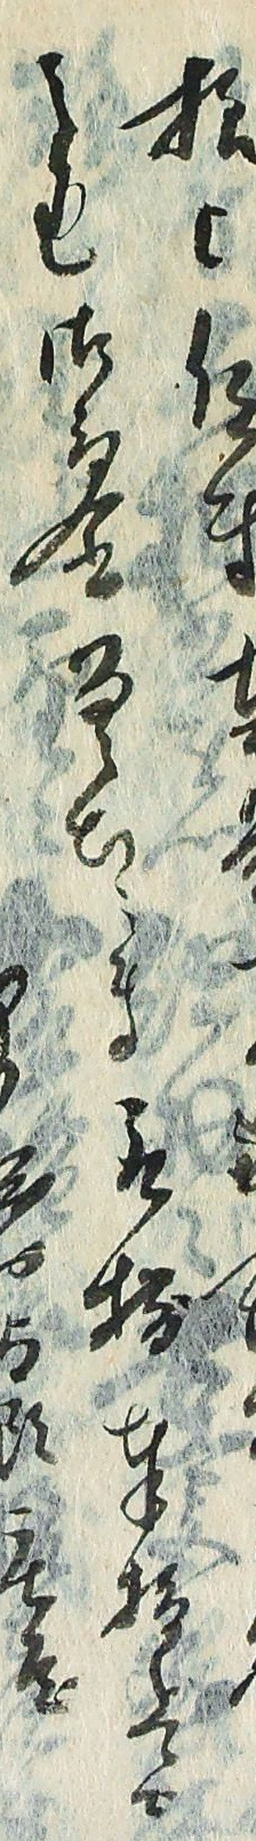之通御受書差出候に付取揃奉指上候以上
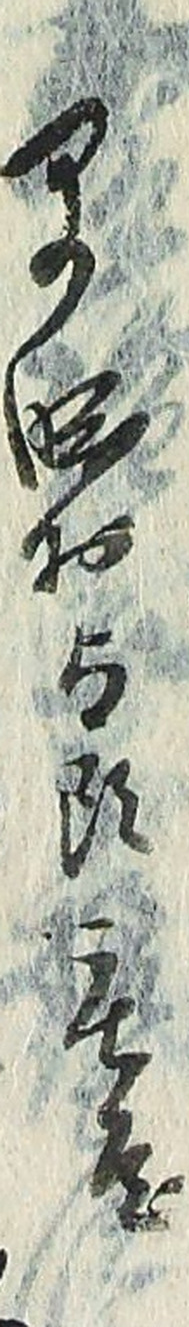早淵村与頭庄屋
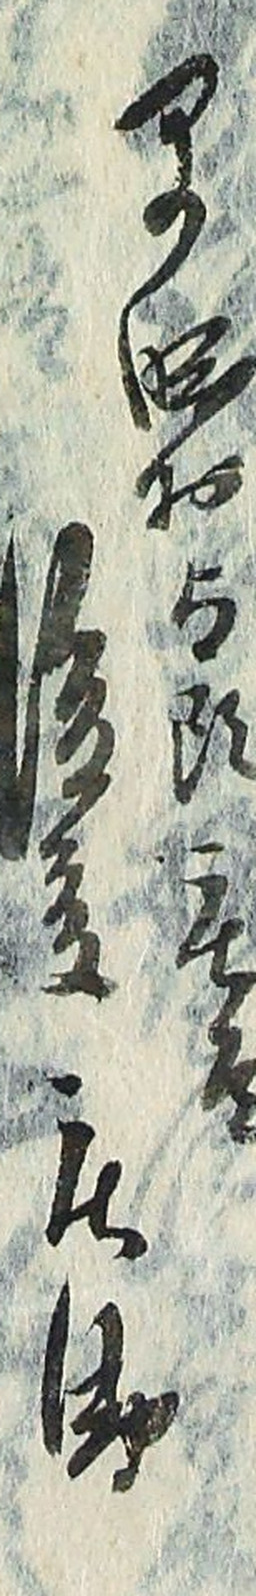後藤庄助
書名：諸御用御□受書控
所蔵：鳴門教育大学 Naruto University of Education
